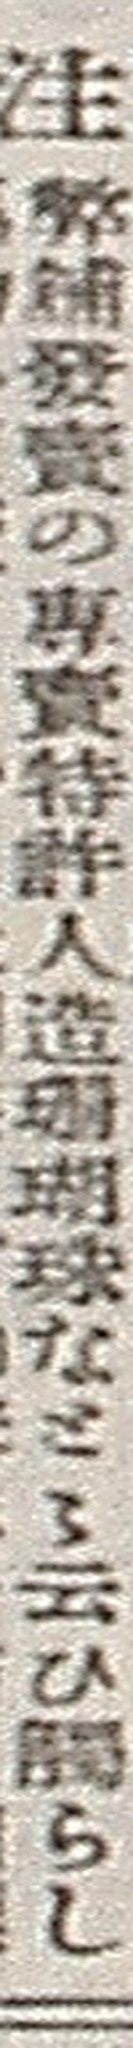弊舗発売の専売特許人造珊瑚珠なと〻云ひ觸らし
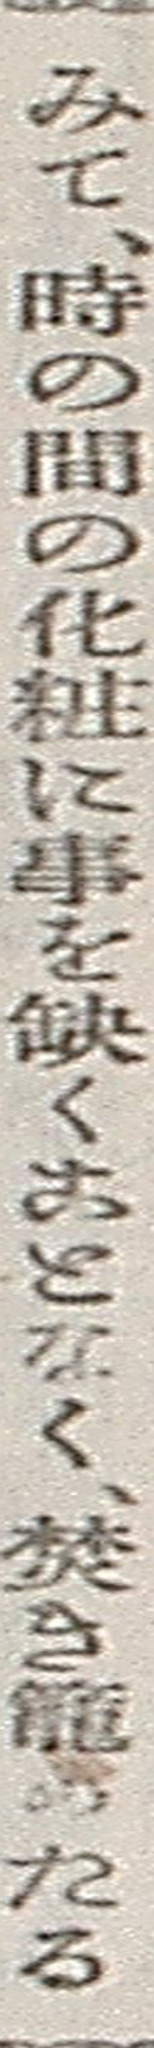みて、時の間の化粧に事を欠くことなく、焚き籠めたる
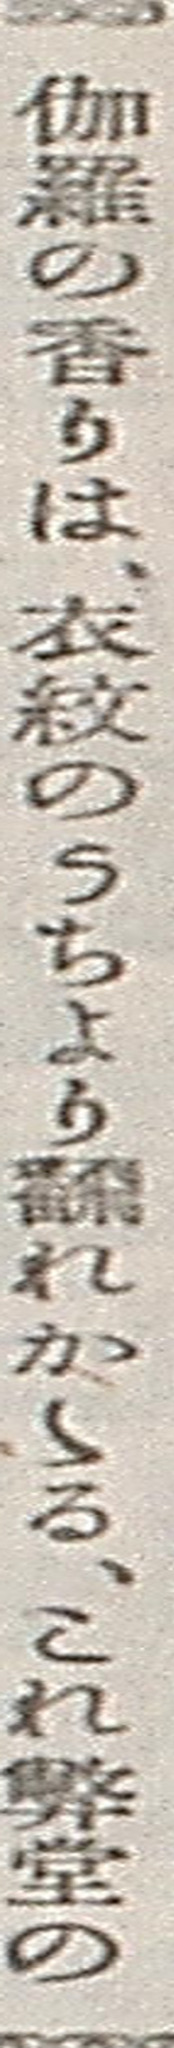伽羅の香りは、衣紋のうちより翻れかゝる、これ弊堂の
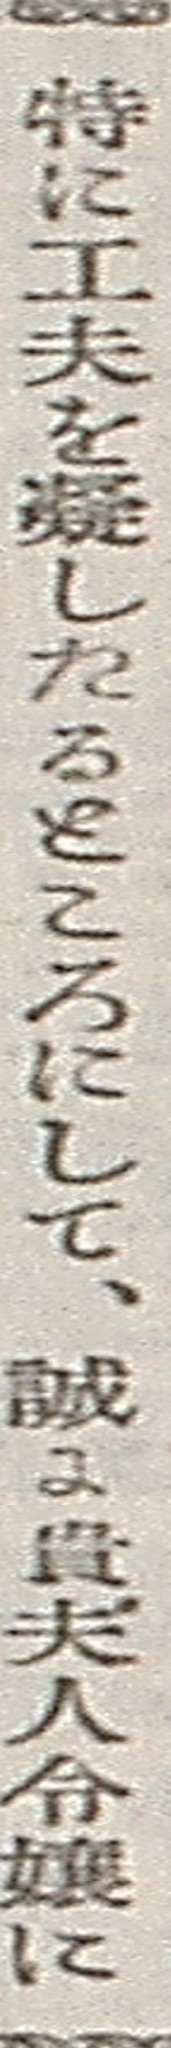特に工夫を凝したるところにして、誠に貴夫人令嬢に
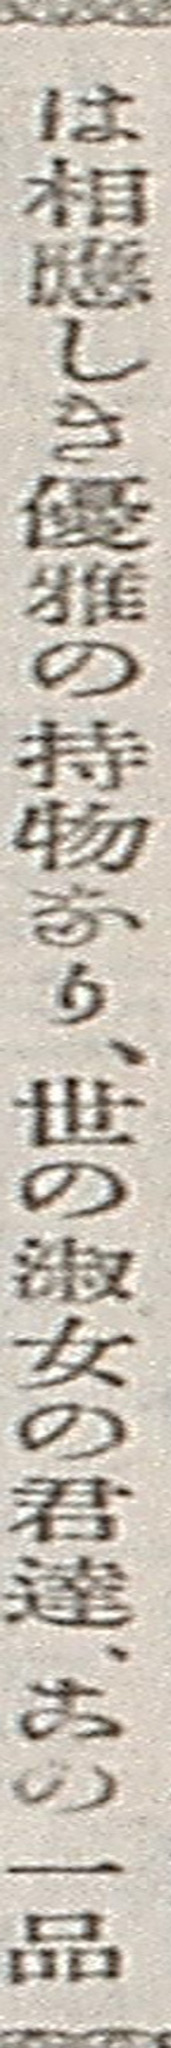は相応しき優雅の持物なり、世の淑女の君達、この一品
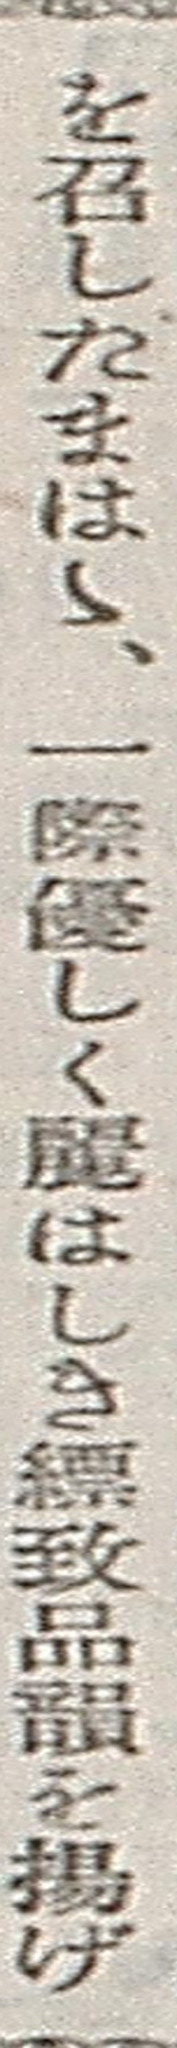を召したまはゝ、一際優しく麗はしき縹致品韻を掲げ
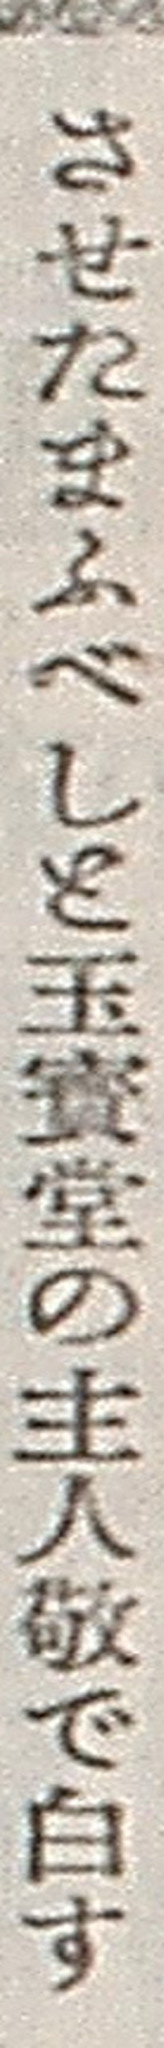させたまふべしと玉宝堂の主人敬で白す
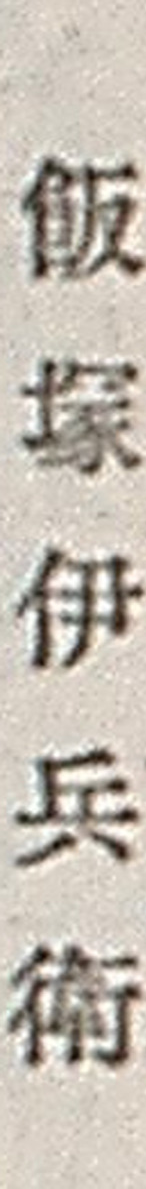飯塚伊兵衛

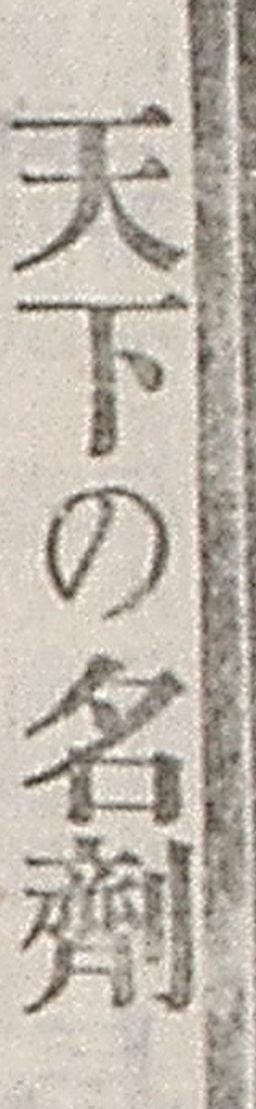天下の名剤
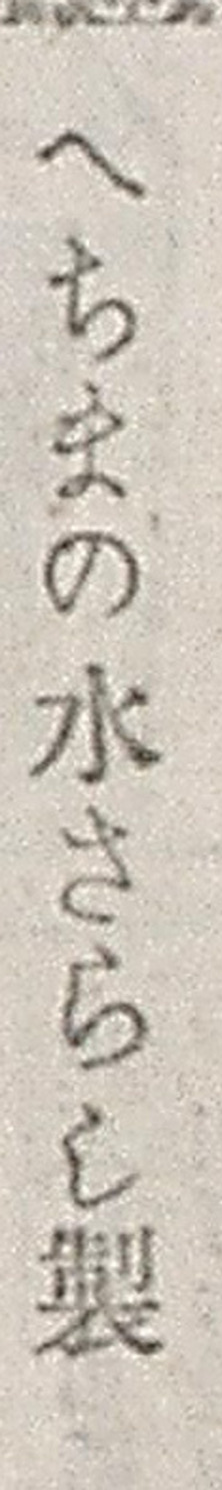へちまの水さらし製
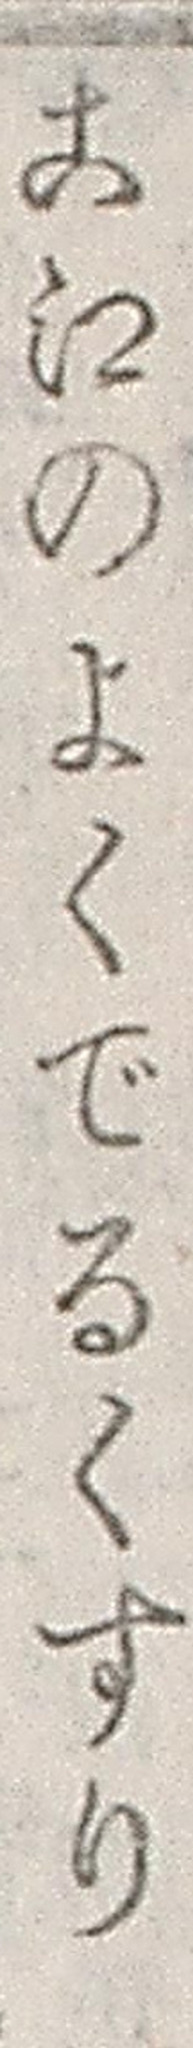こえのよくでるくすり
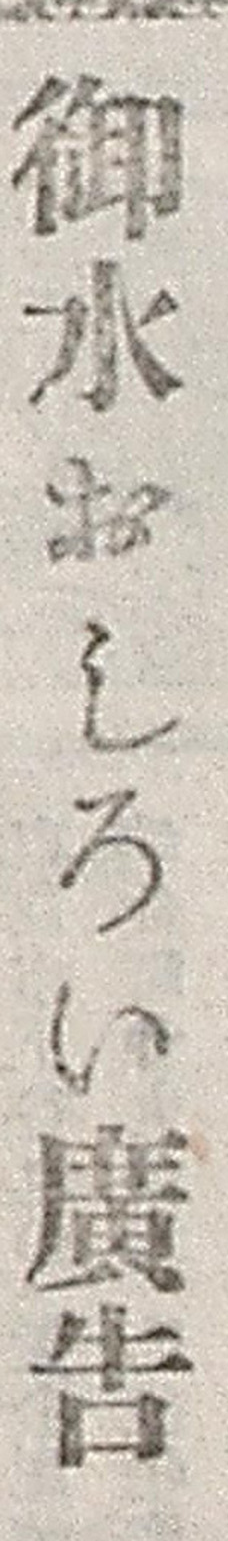御水おしろい広告
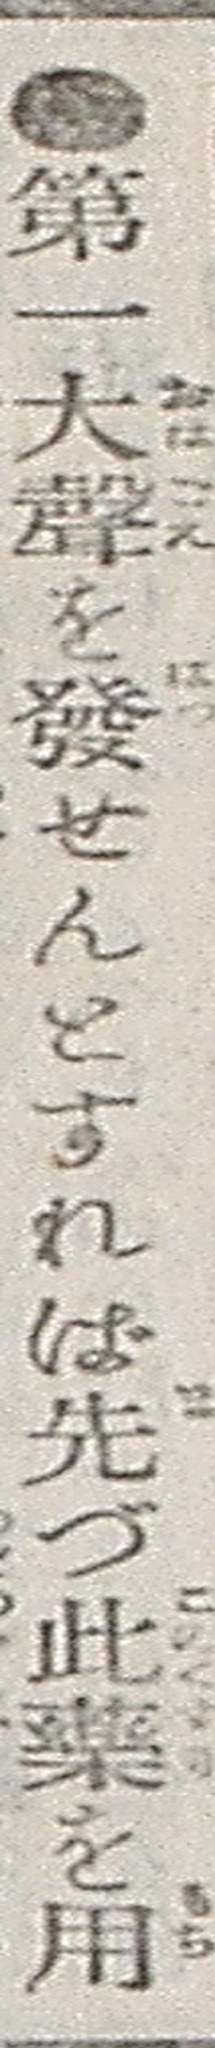●第一大声を発せんとすれば先づ此薬を用
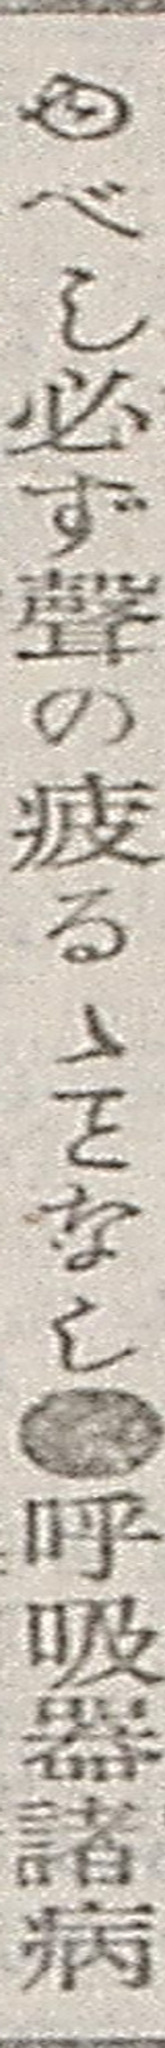ゆべし必ず声の疲るゝことなし●呼吸器諸病
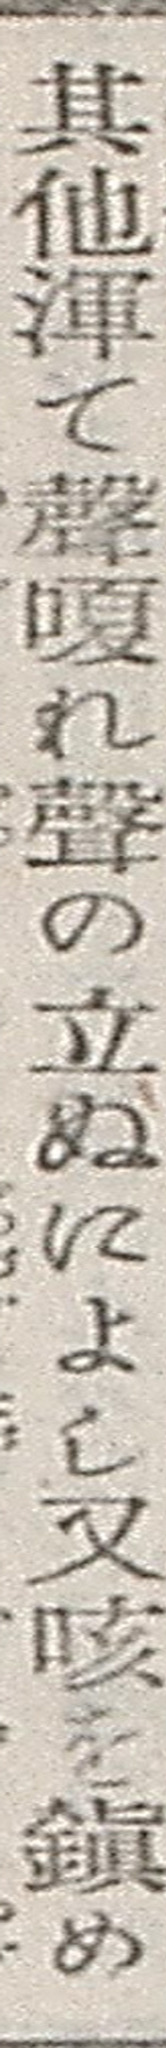其他渾て声嗄れ声の立ぬによし亦咳を鎮め
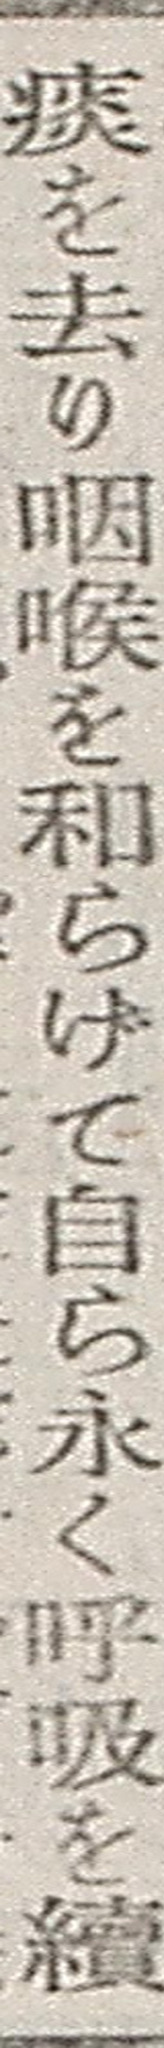痰を去り咽喉を和らげて自ら永く呼吸を続
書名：風俗畫報臨時増刊第百二十四號　洪水地震被害録（上）
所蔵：東京大学地震研究所図書室 Earthquake Research Institute Library, The University of Tokyo, JAPAN
